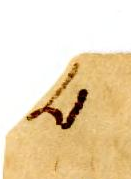4
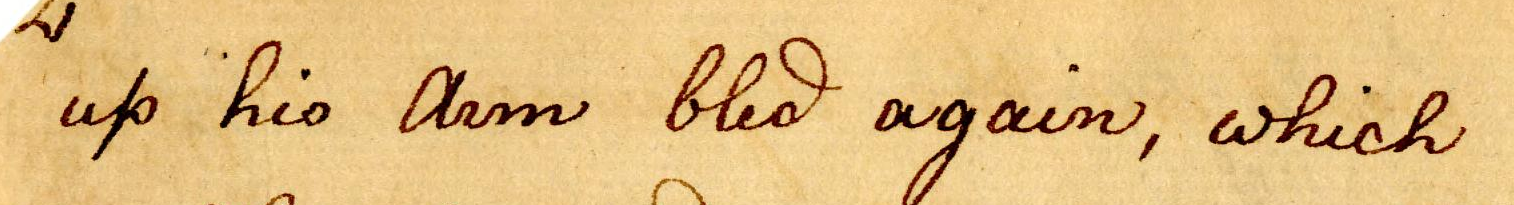up his Arm bled again, which
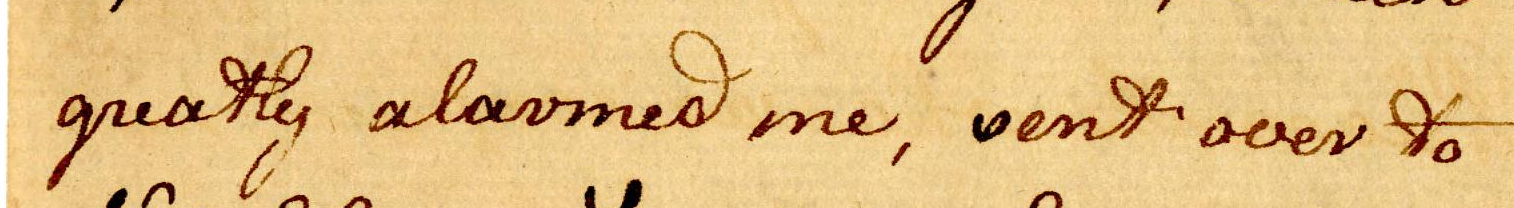greatly alarmed me, sent over to
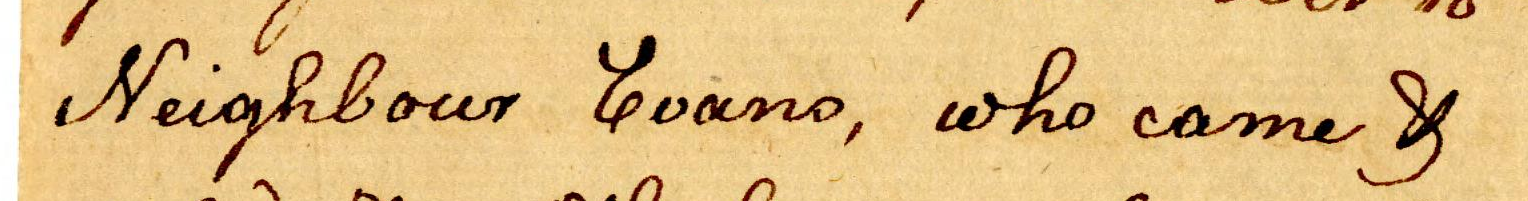Neighbour Evans, who came &
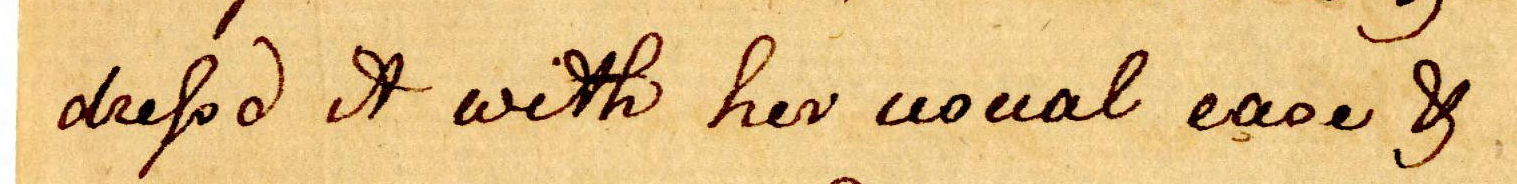dressd it with her usual ease &
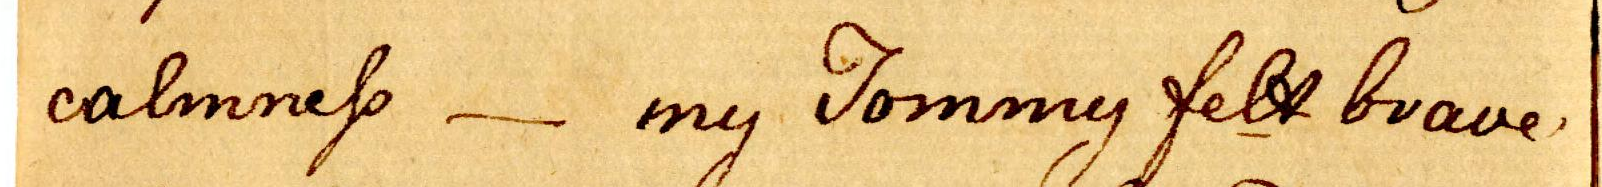calmness- my Tommy felt brave
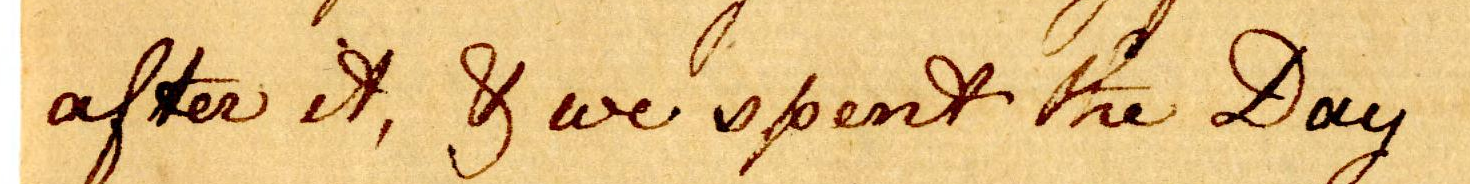after it, & we spent the Day
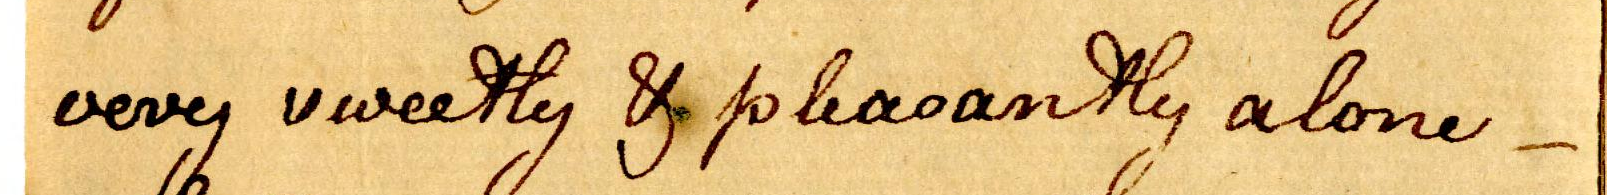very sweetly & pleasantly alone-
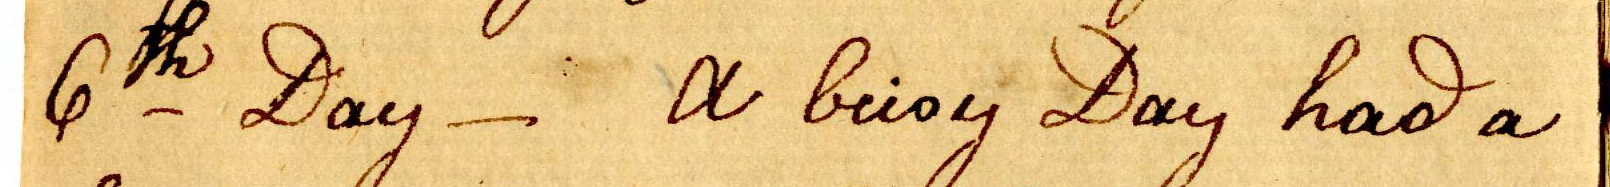6^th Day- A busy Day had a
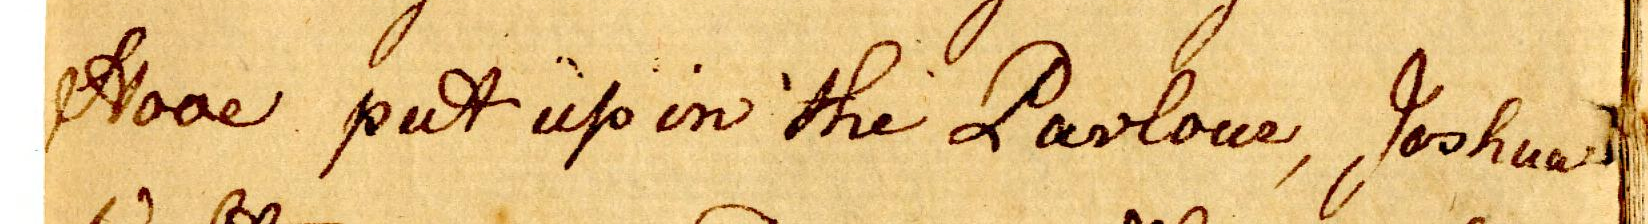Stove put up in the Parlour, Joshua
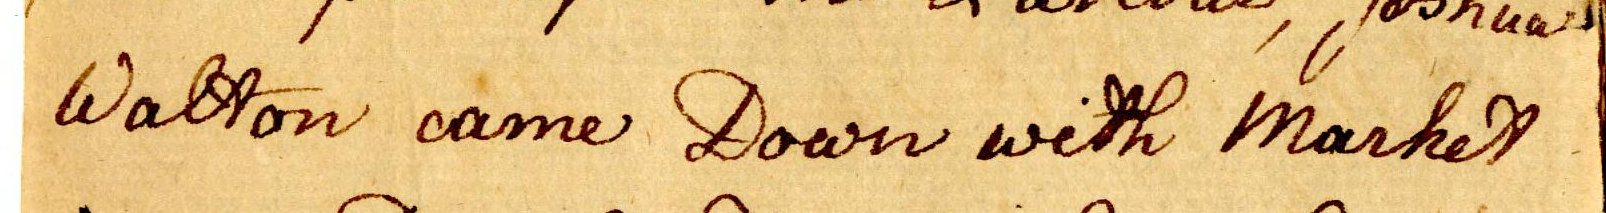Walton came Down with Market
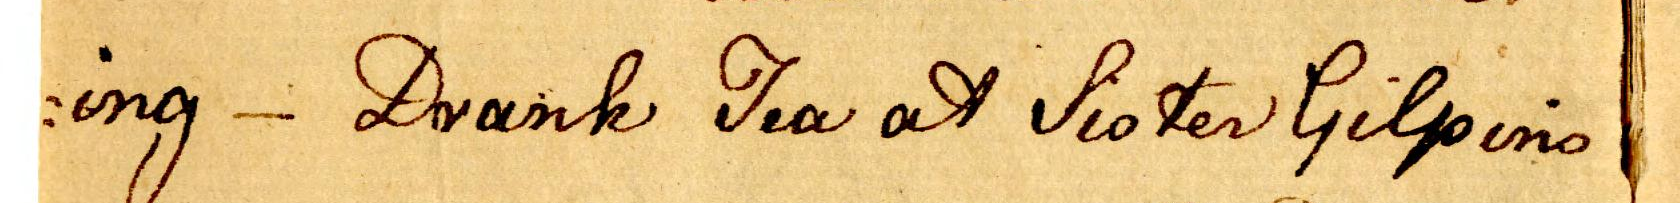-ing- Drank Tea at Sister Gilpins
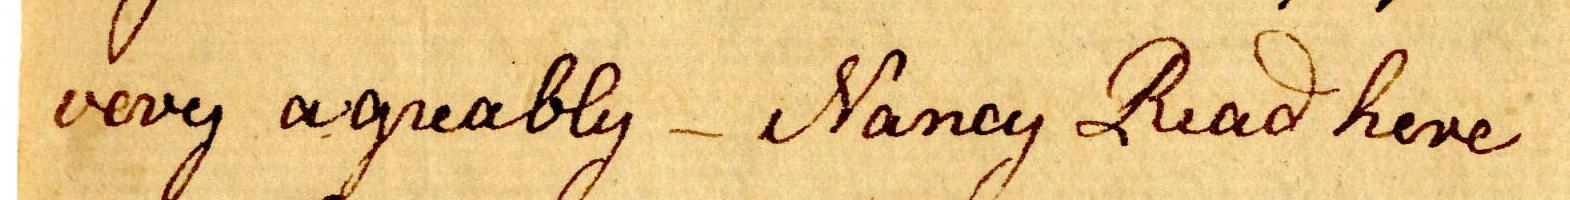very agreably- Nancy Read here
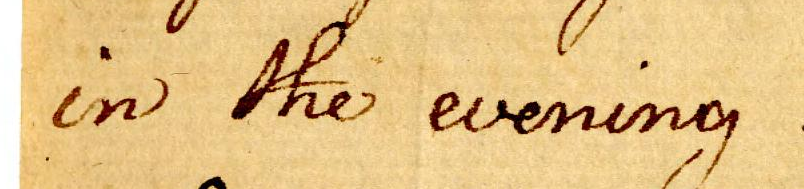in the evening
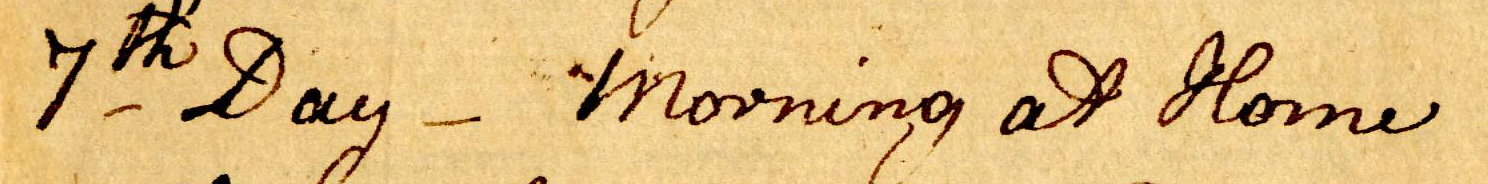7^th Day- Morning at Home
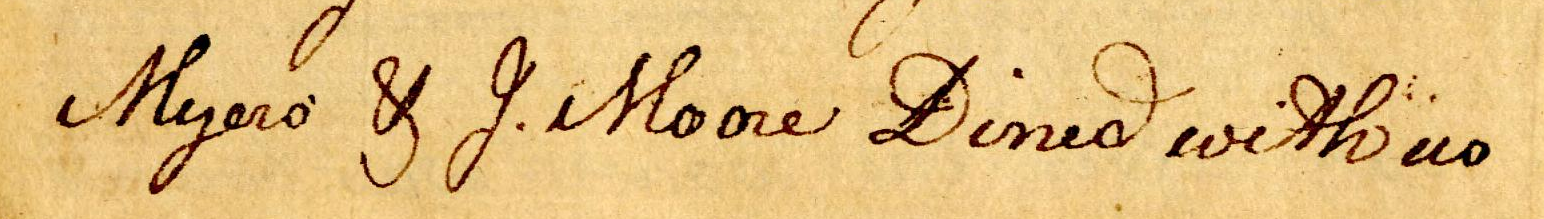Myers & J. Moore Dined with us
